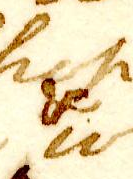&
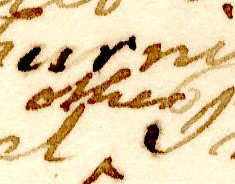other
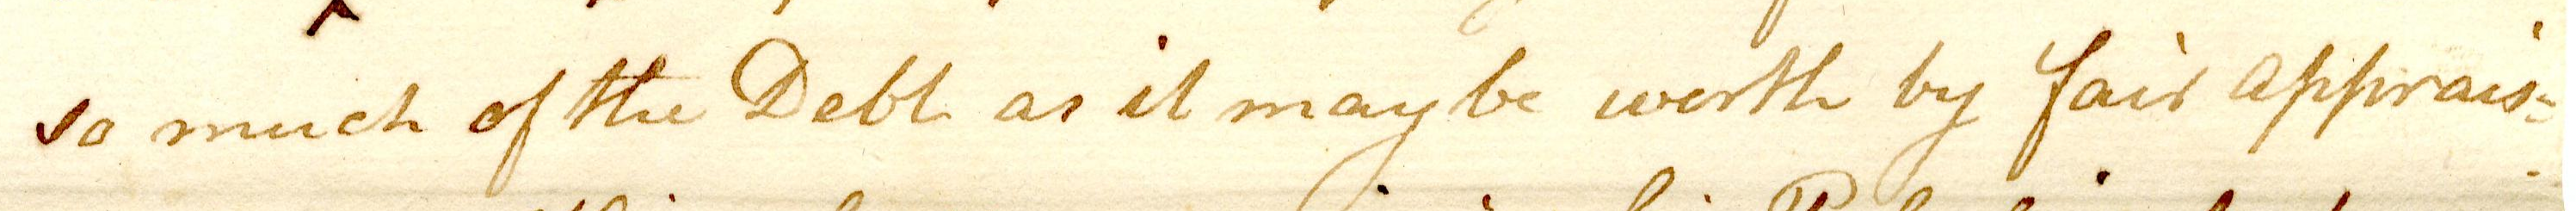so much of the Debt as it may be worth by fair apprais-
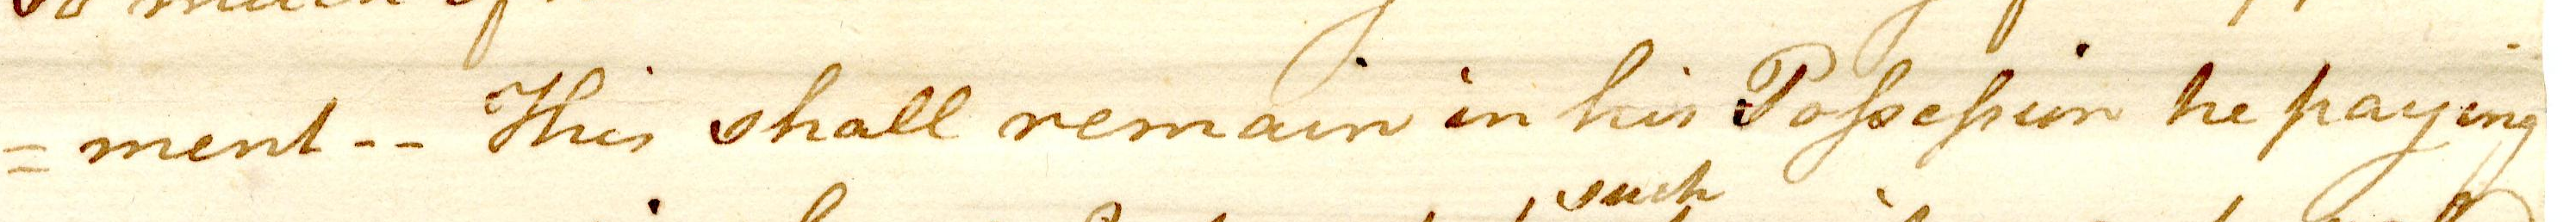-ment.. This shall remain in his Possession he paying
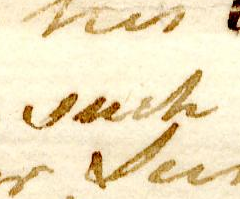such
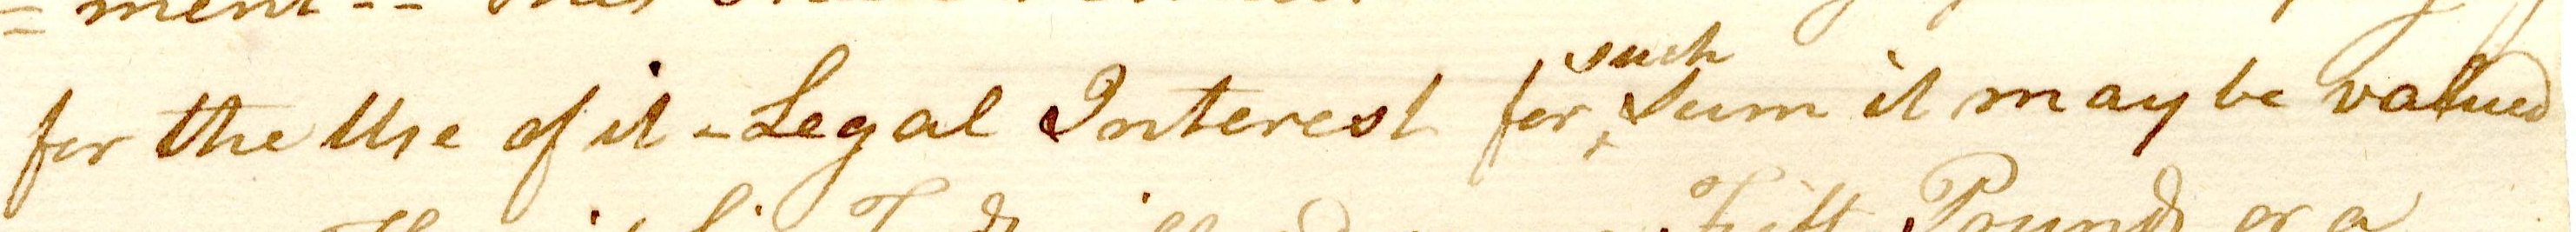for the Use of it, Legal Interest for ^ sum it may be valued
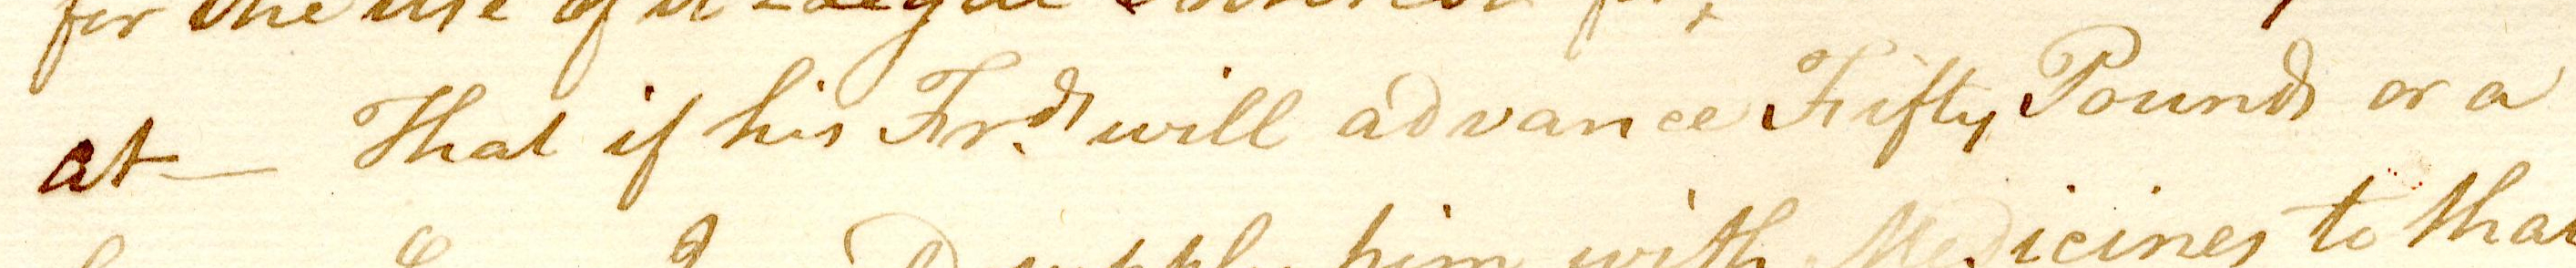at. That if his Fr^d. will advance Fifty Pounds or a
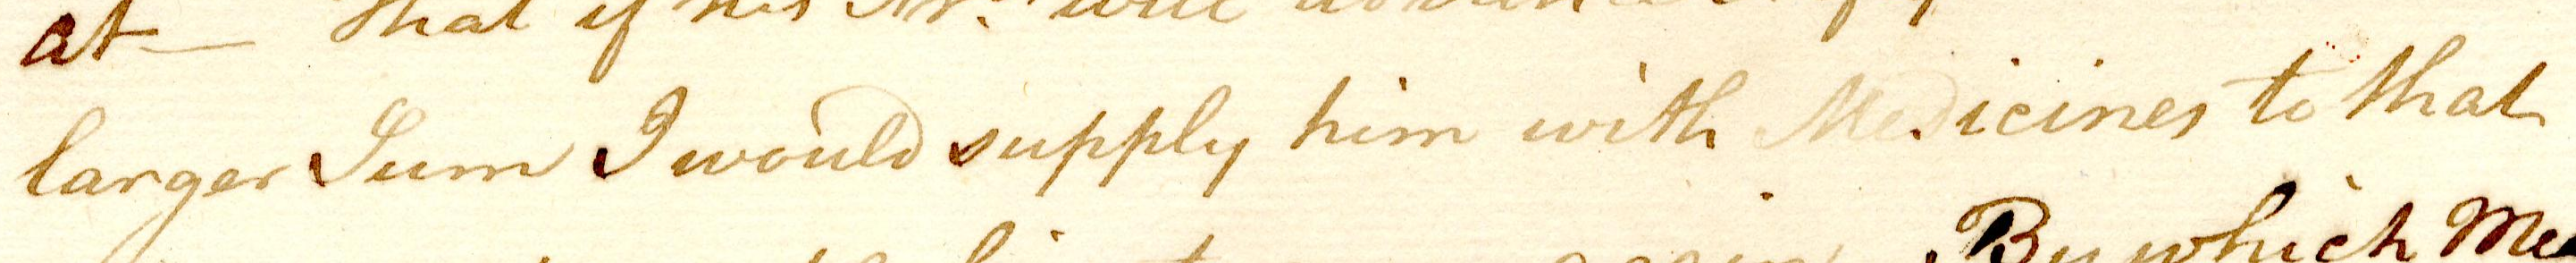larger Sum I would supply him with Medicines to that
